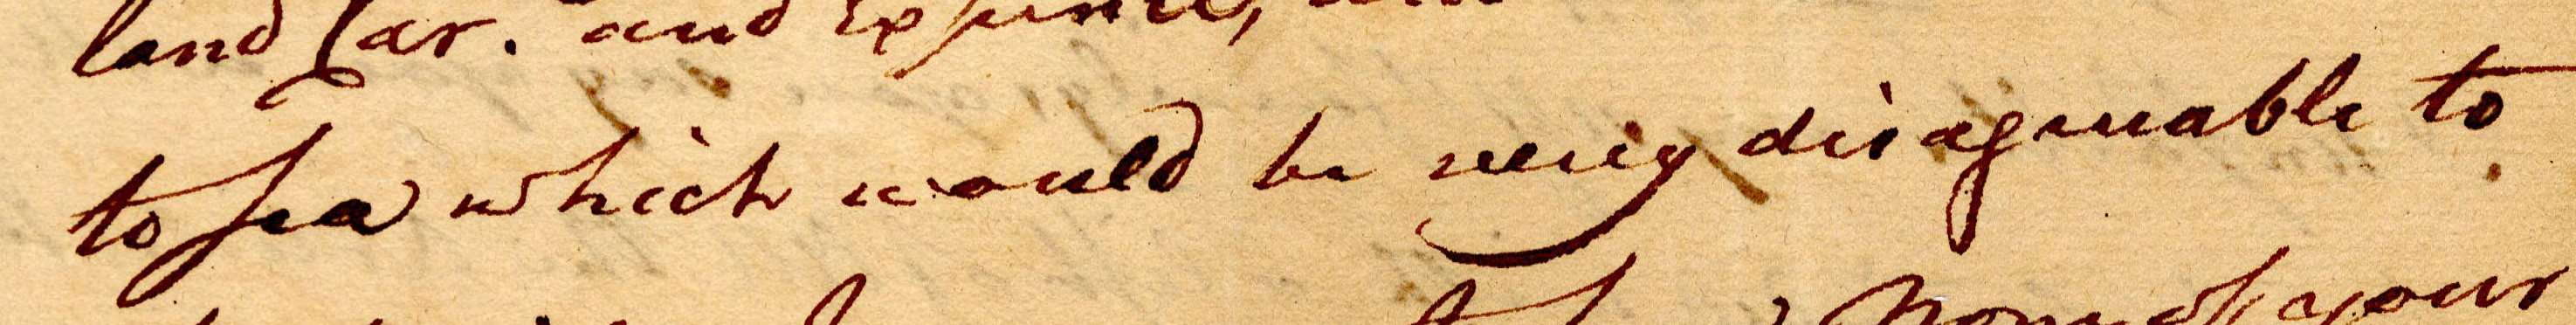to Sea which would be very disagreeable to
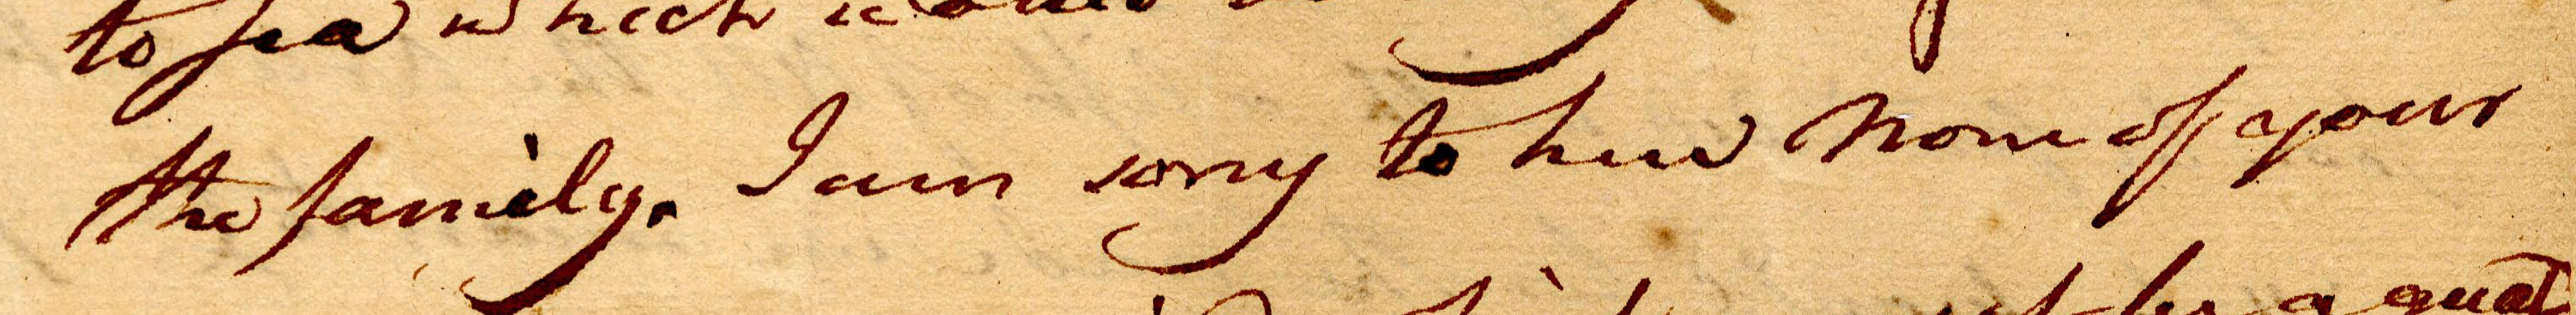the family. I am sorry to here none of your
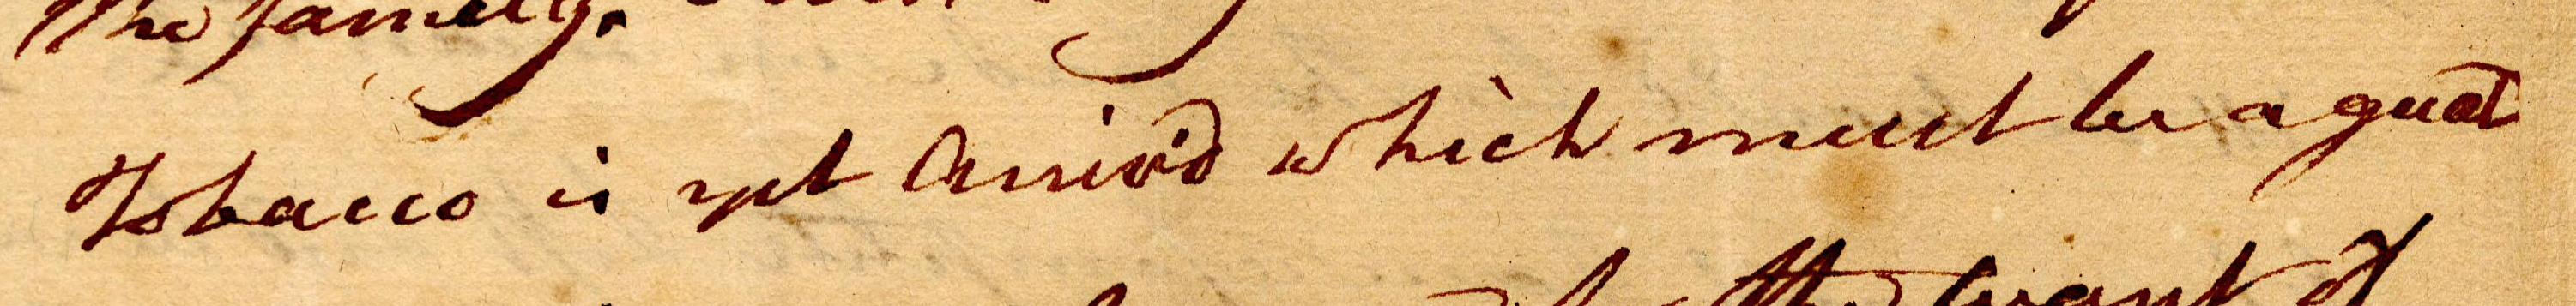tobacco is yet Arriv'd which must be a great
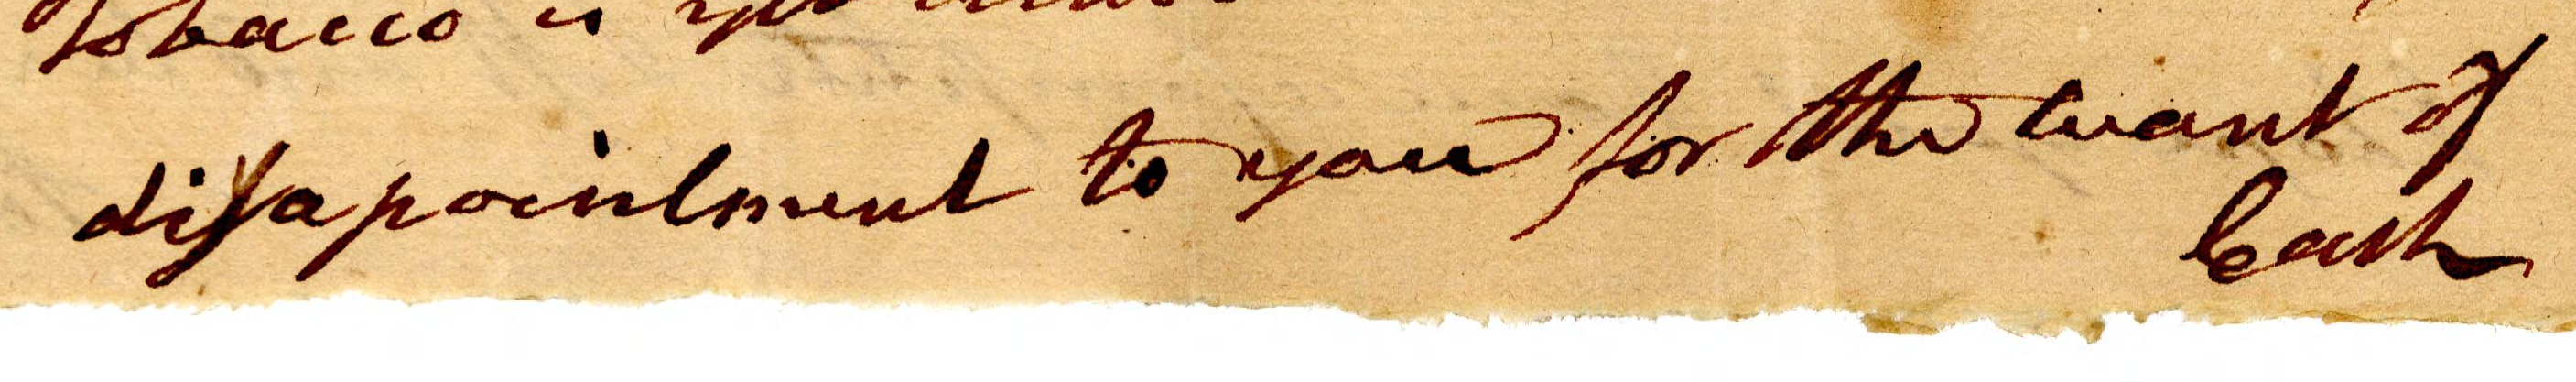disapointment & to you for the event of
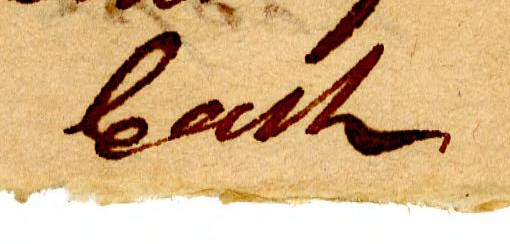back
